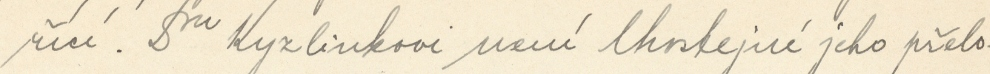řící. Dr Kyzlinkovi není lhostejné jeho přelo-
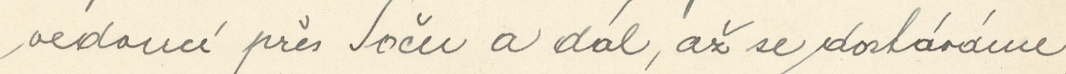vedoucí přes Soču a dál, až se dostáváme
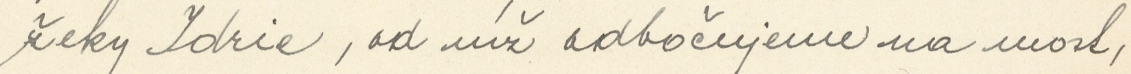řeky Idrie, od níž odbočujeme na most,
